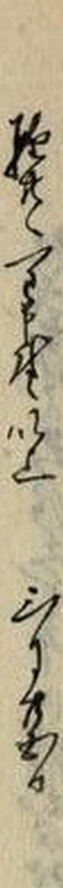軽共へ可被申付候以上三月廿五日御目付
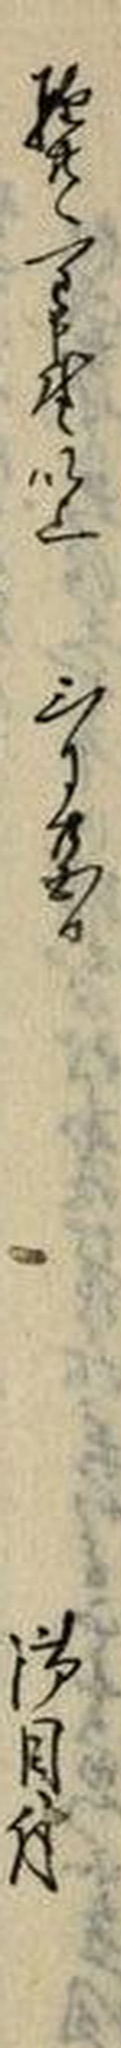軽共へ可被申付候以上三月廿五日御目付
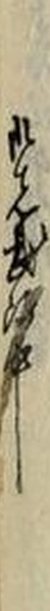御先武頭中
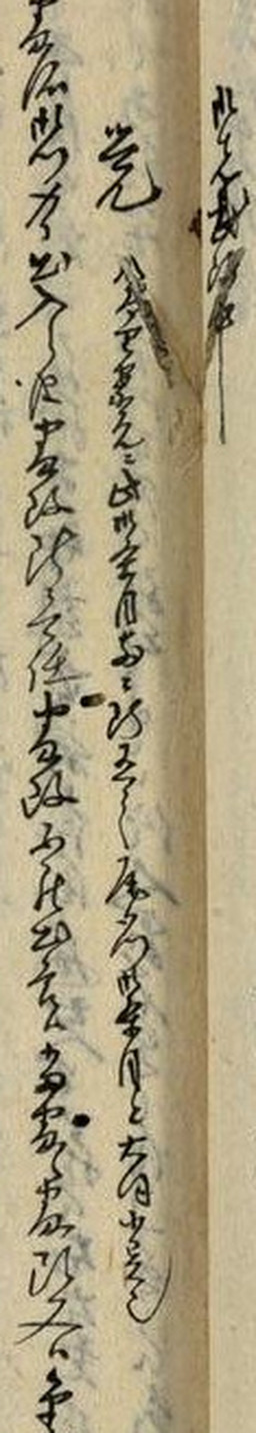覚八百里案スルニ此御条目前ニ断有之瓦御門御条目と大同小異也
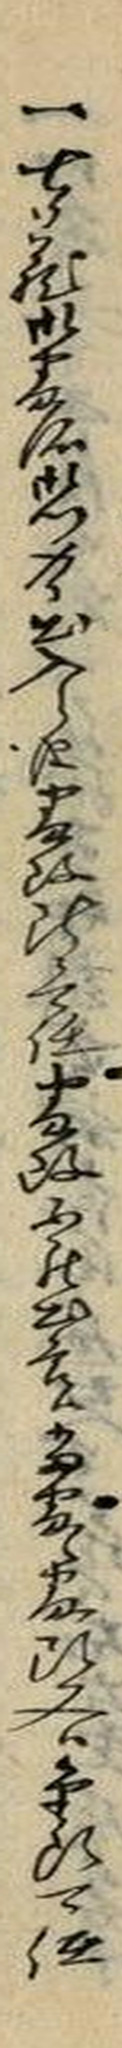一七ツ蔵御番所御門〆り出入之儀番改断ニ可任番改不罷出節ハ当番之番頭又ハ筆頭可任
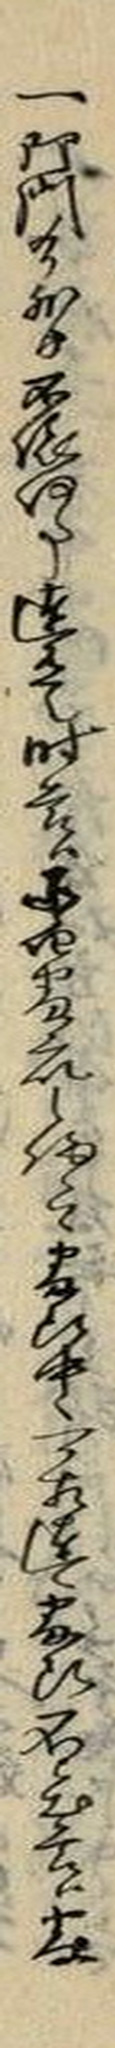一御門〆り外ゟ不限何事達有之時節ハ承届番衆之儀侯ハヽ番頭中へ可相達候番頭不被出節ハ番
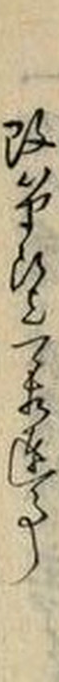改筆頭迄可相達事
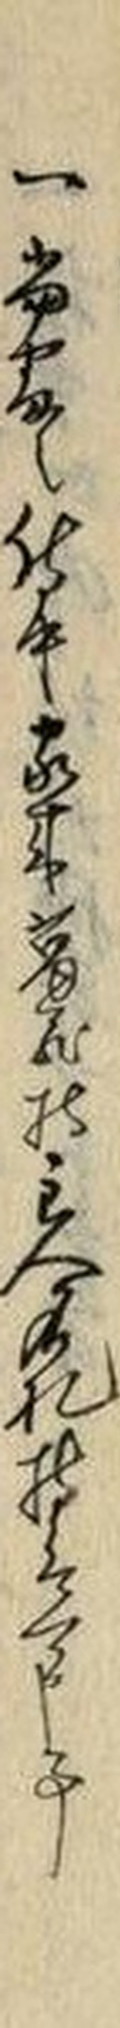一当番之仕事家来葛籠持主人名札持参可申事
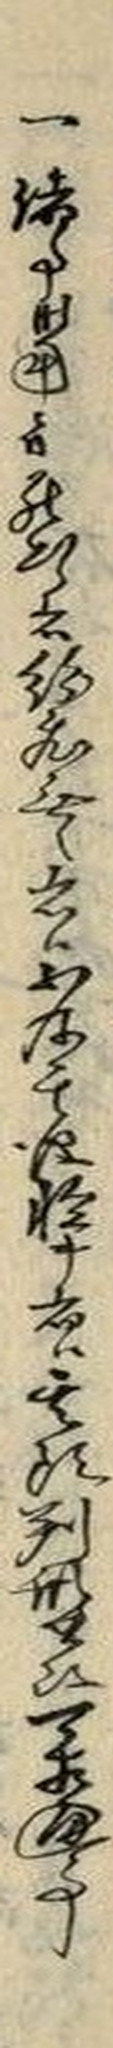一諸事御用ニ付罷出候者紛敷無之者ハ不及其儀軽キ者ハ其頭判形を改可相通候事
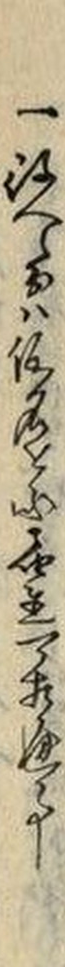一役人之分ハ仮名を承届可相通候事
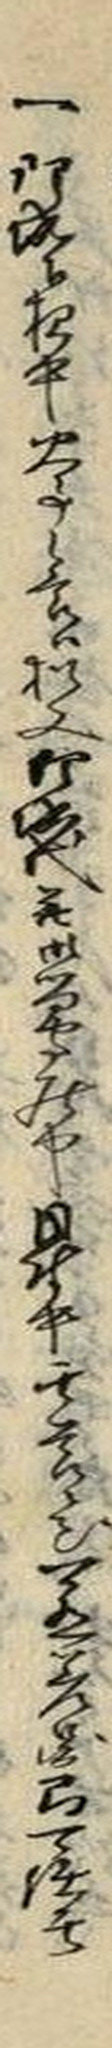一御城下夜中火事之節ハ猶又御城代并御留守居中目付中其節ニ至可有差図候間可任其
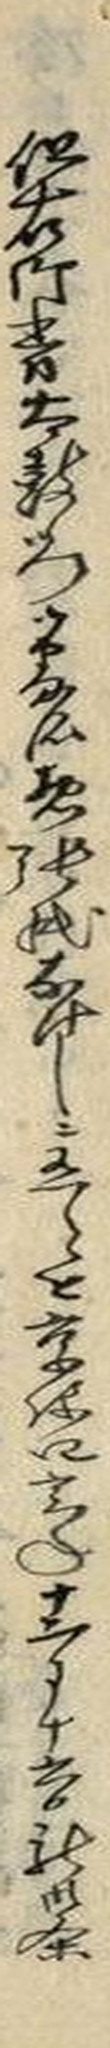但右御書付太鼓御門御番所惣張紙なけしニ有之候を享保四亥年十二月十六日新御条
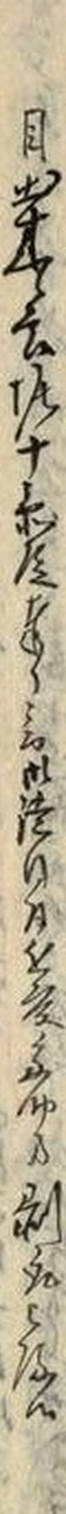目出来候節堀十兵衛殿達候ニ而御徒目付近藤多助方剥取被帰候
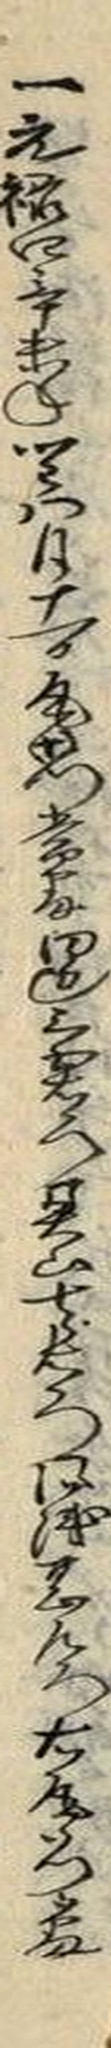一元禄四辛未年閏八月十一日瓦御門当番田辺三五右衛門奥山十郎右衛門湯浅甚左衛門右瓦御門番
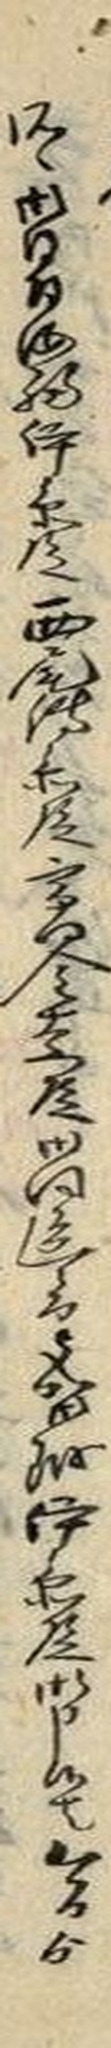所へ御目付海福伊兵衛殿西尾伝兵衛殿冨田金太夫殿御同道ニ而被成御越伊兵衛殿御申候者今日ゟ
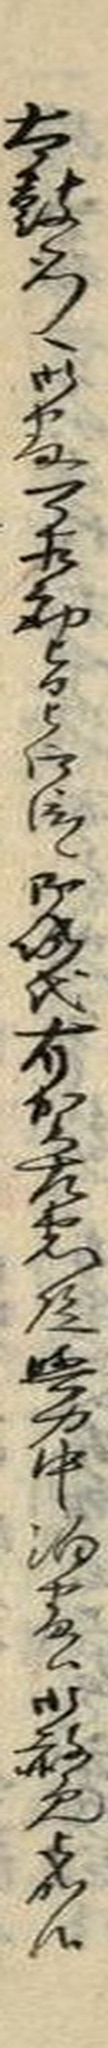太鼓御門へ御番可相勤旨被仰渡候御城代有賀左衛門殿与力中泊番ハ御赦免被成候
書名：御門御櫓之部
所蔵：福井県文書館 Fukui Prefectural Archives
